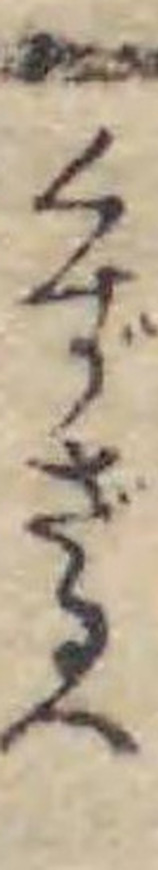くずざるへ
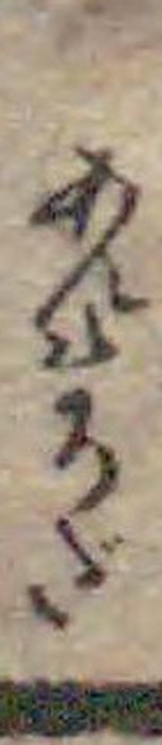あんまりだ
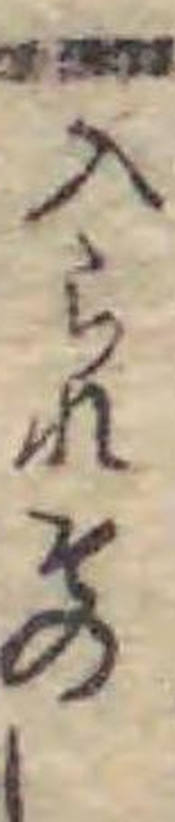入られその
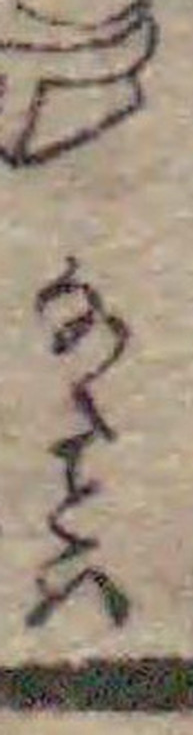なくことは
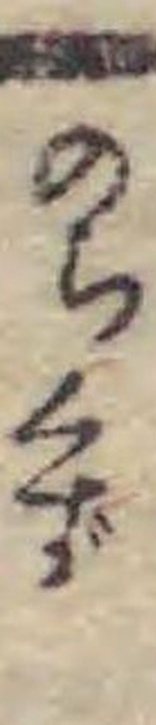のちくず
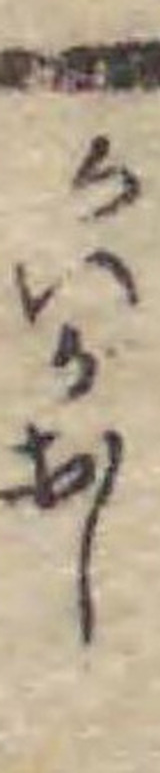かいがおし
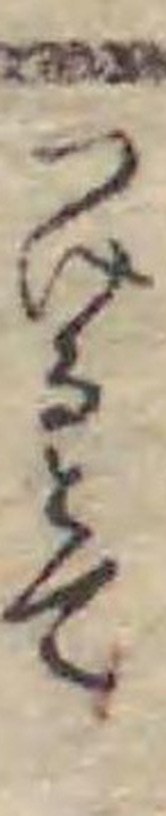つけるとて
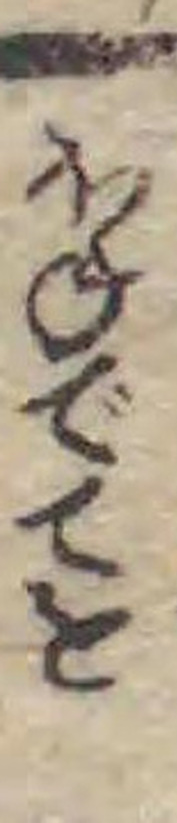ほねでてを
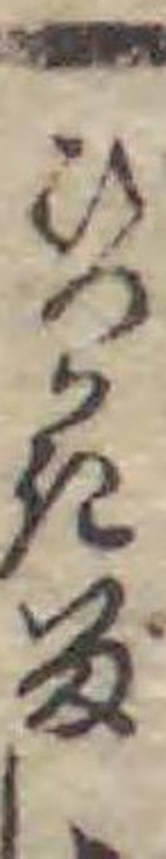ひつかきいま
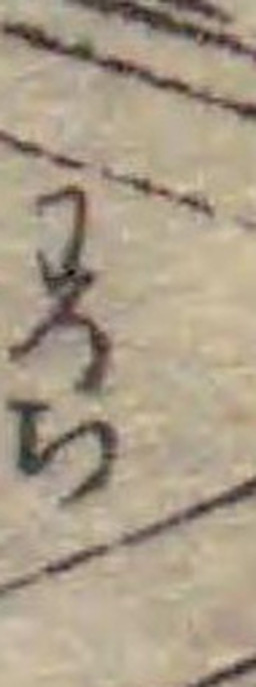わつち
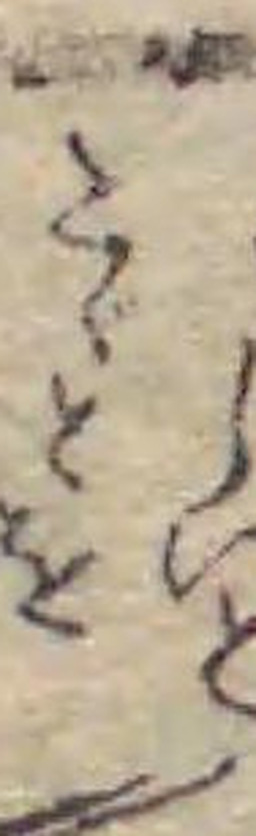こゞとを
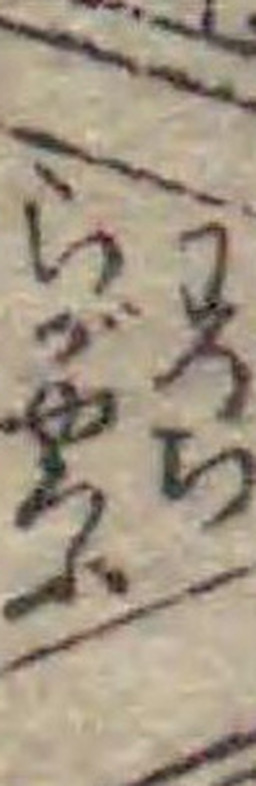らがやろふ
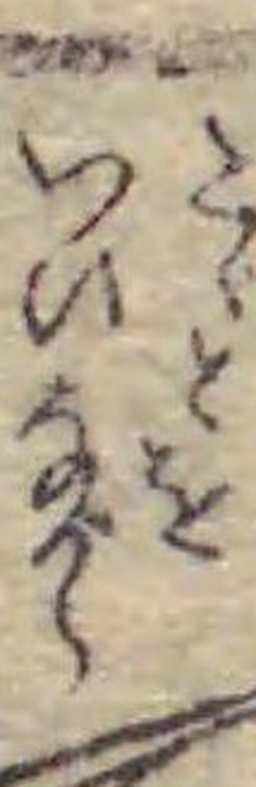いひながら
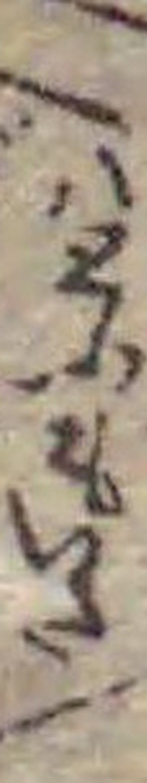はとふもいた
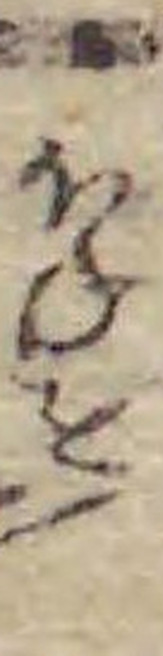ほねを
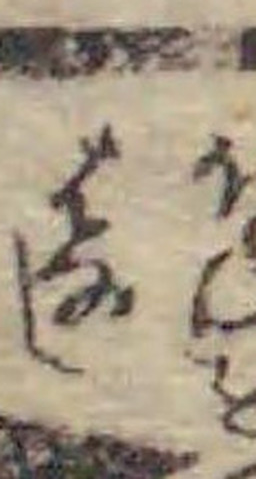はなし
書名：紙屑身上噺 : 3巻
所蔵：国立国会図書館 National Diet Library, JAPAN
